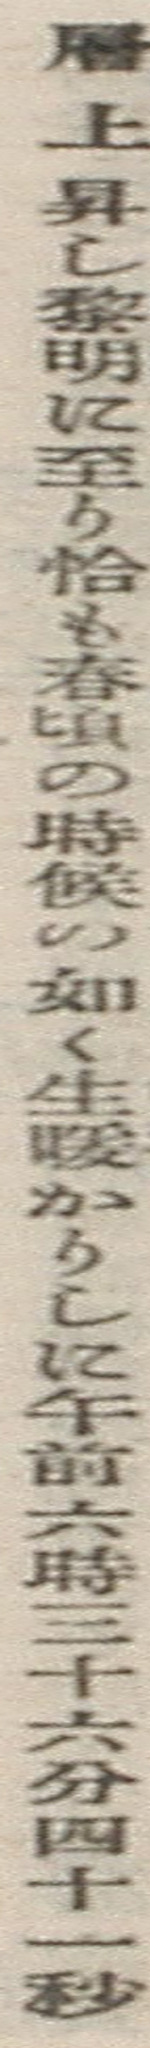層上昇し黎明に至り恰も春頃の時候の如く生暖かりしに午前六時三十六分四十一秒
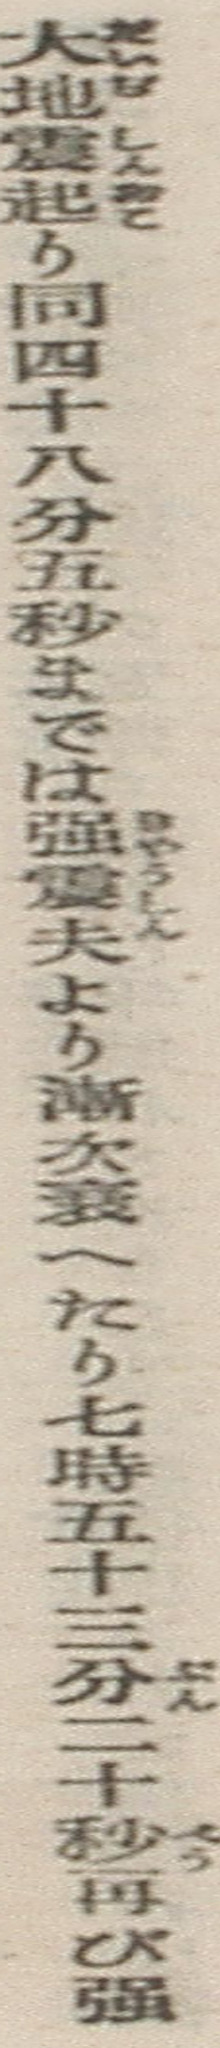大地震起り同四十八分五秒までは強震夫より漸次衰へたり七時五十三分二十秒再び強
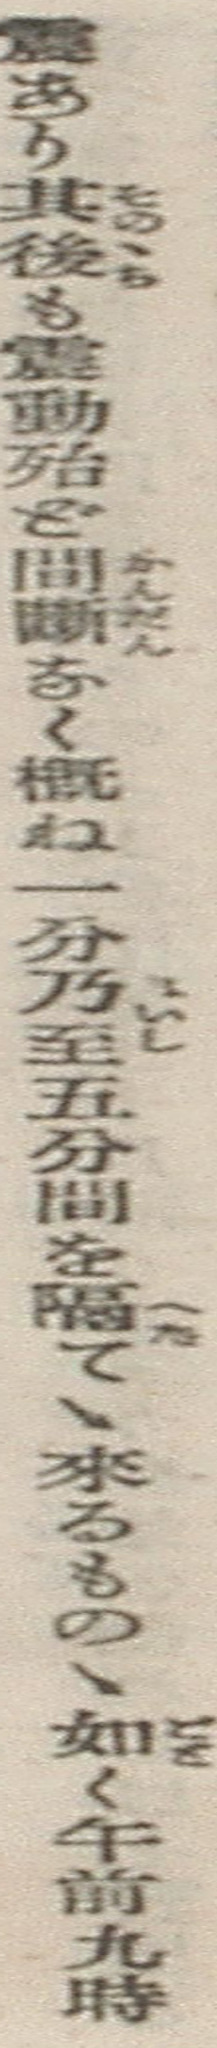震あり其後も震動殆ど間断なく概ね一分乃至五分を隔てゝ来るものゝ如く午前九時
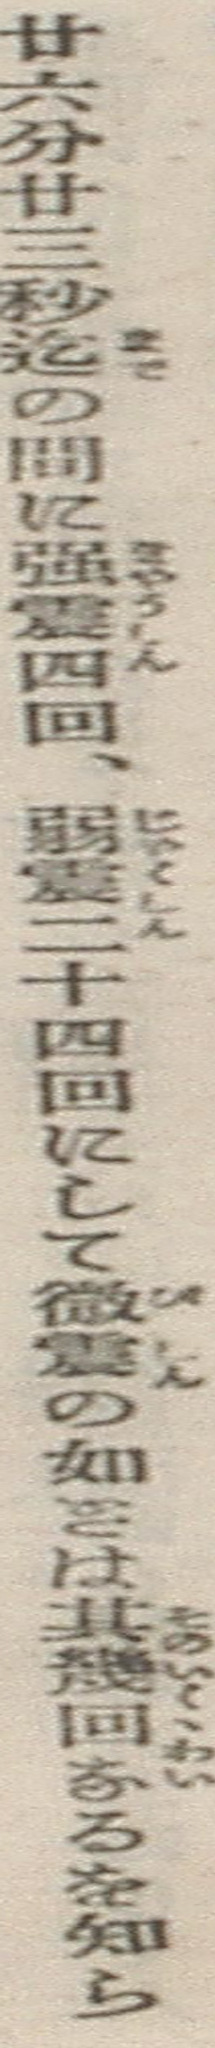廿六分廿三秒迄の間に強震四回、弱震二十四回にして微震の如きは其幾回なるを知ら
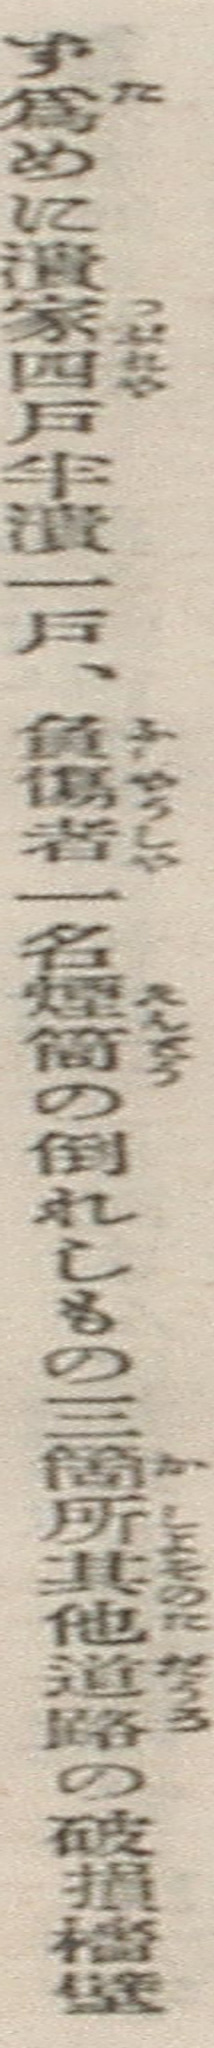ず為めに潰家四戸半潰一戸、負傷者一名煙筒の倒れしもの三箇所其他道路の破損檣壁
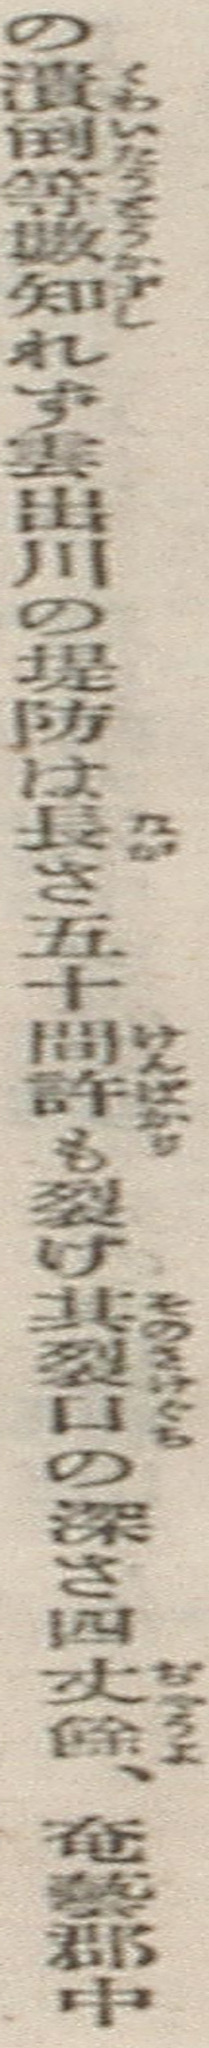の潰倒等數知れず雲出川の堤防は長さ五十間許も裂け其避口の深さ四丈餘、奄藝郡中
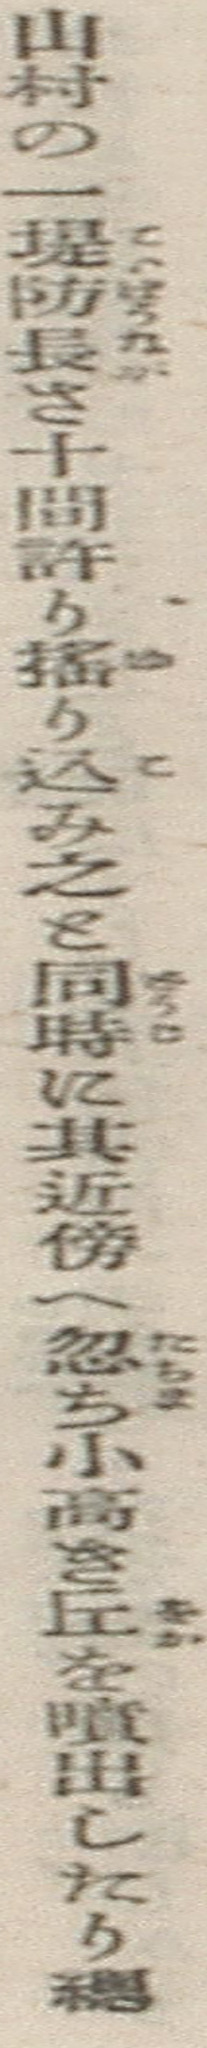山村の一堤防長さ十間許り揺り込み之と同時に其近傍へ忽ち小高き丘を噴出したり總
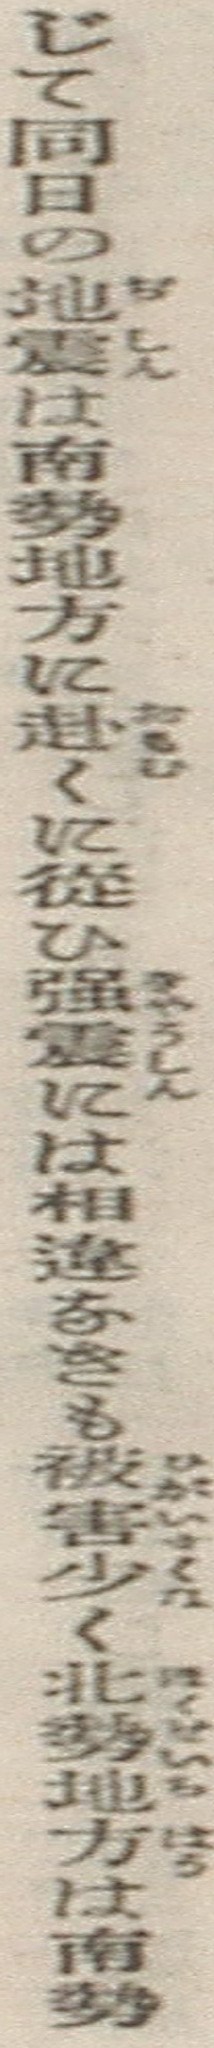じて同日の地震は南勢地方に赴くに従ひ強震には相違なきも被害少く北勢地方は南勢
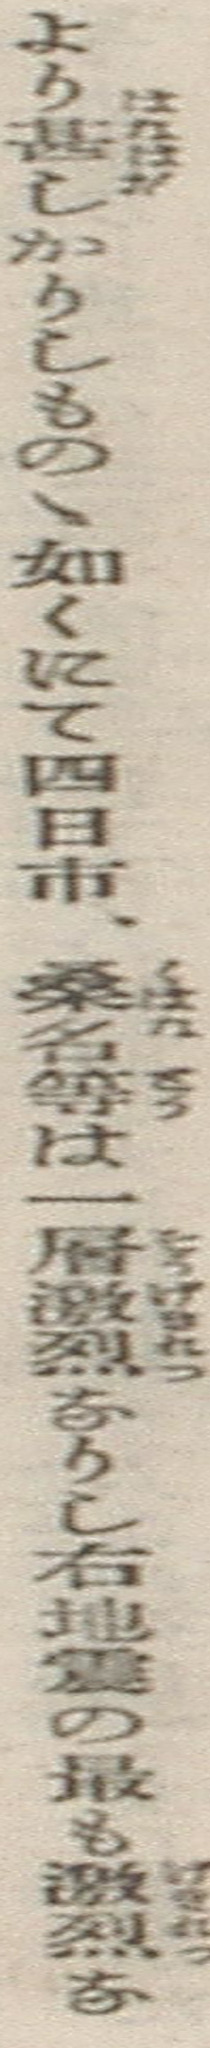より甚しかりしものゝ如くにて四日市、桑名等は一層激烈なりし右地震の最も激烈な
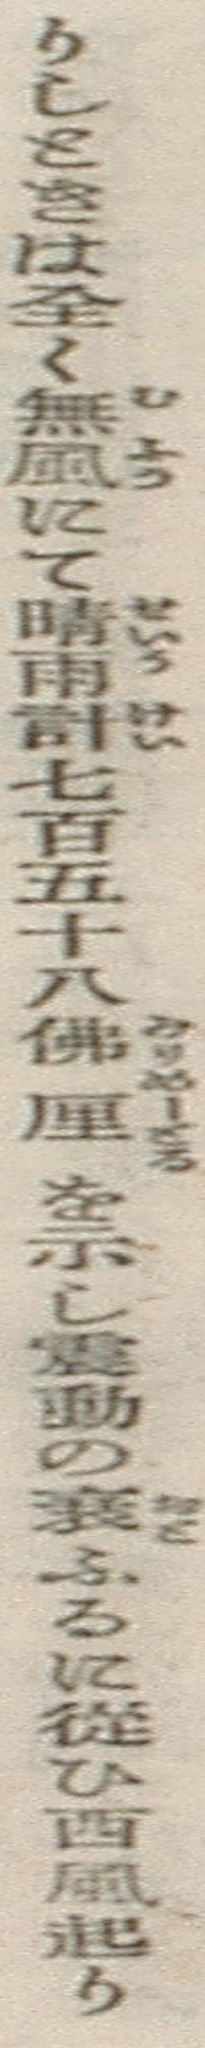りし時は全く無風にて晴雨計七百五十八佛厘を示し震動の衰ふるに従ひ西風起り
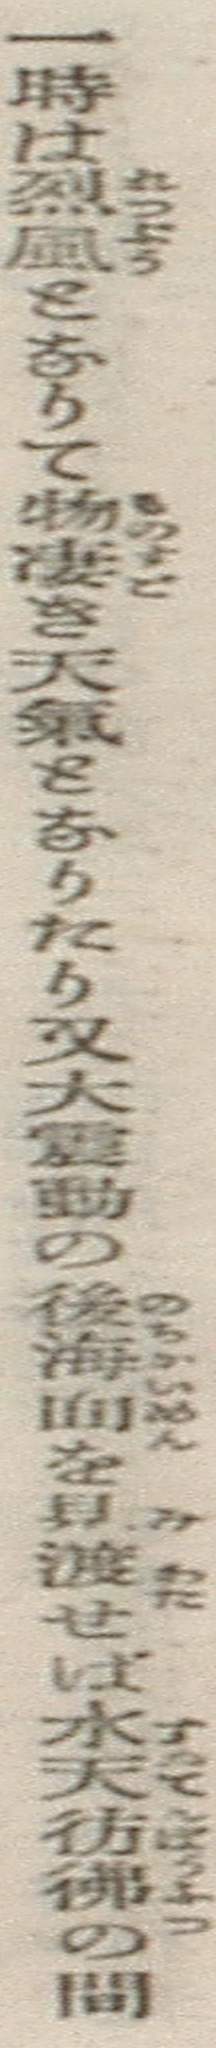一時は烈風となりて物凄き天気となりたり又大震動の後海面を見渡せば水天彷彿の間
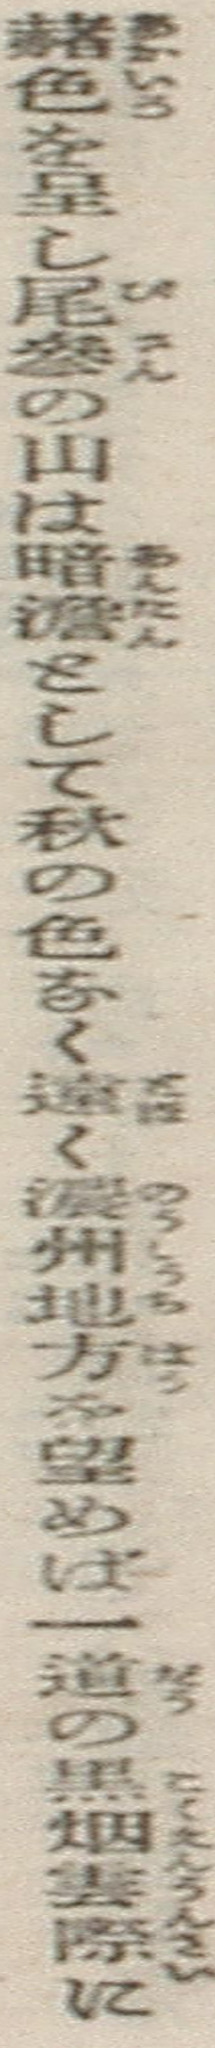赭色を呈し尾参の山は暗澹として秋の色なく遠く濃州地方を望めば一道の黒烟雲際に
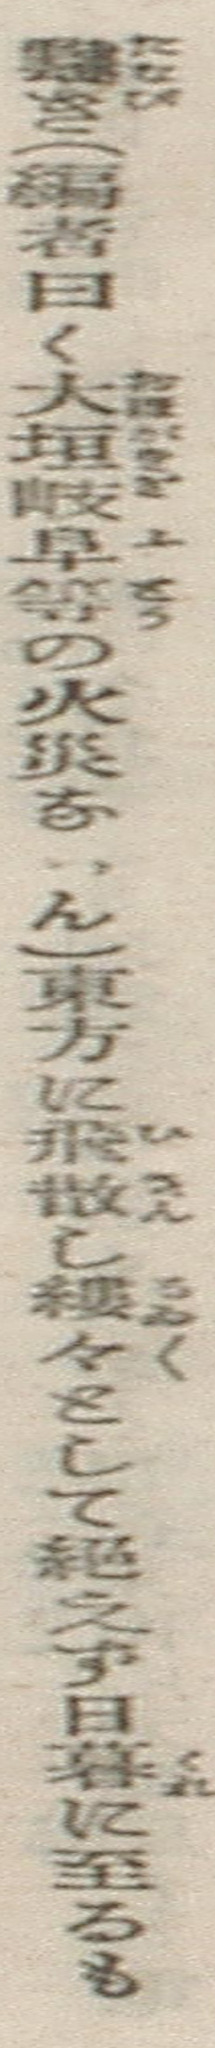靡きの火災ならん）東方に飛散し縷々として絶えず日暮に至るも
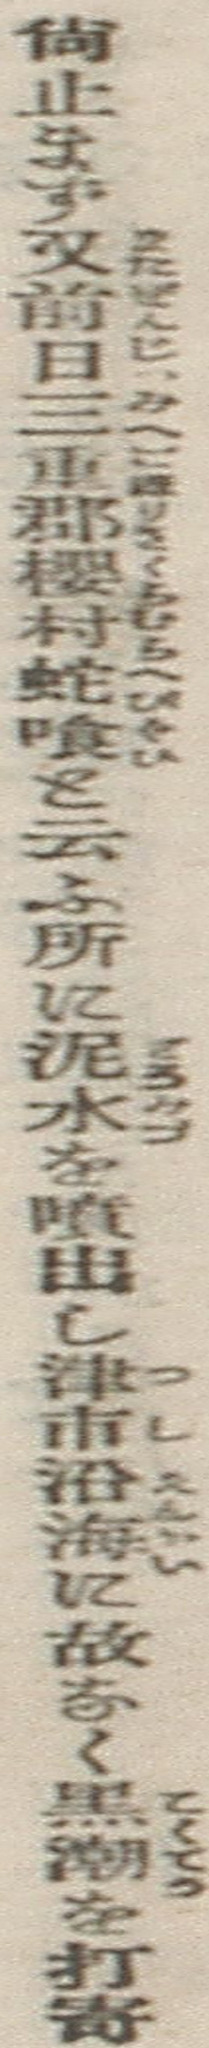尚止まず又前日三重郡櫻村蛇喰と云ふ所に泥水噴出し津市沿海に故なく黒潮を打寄

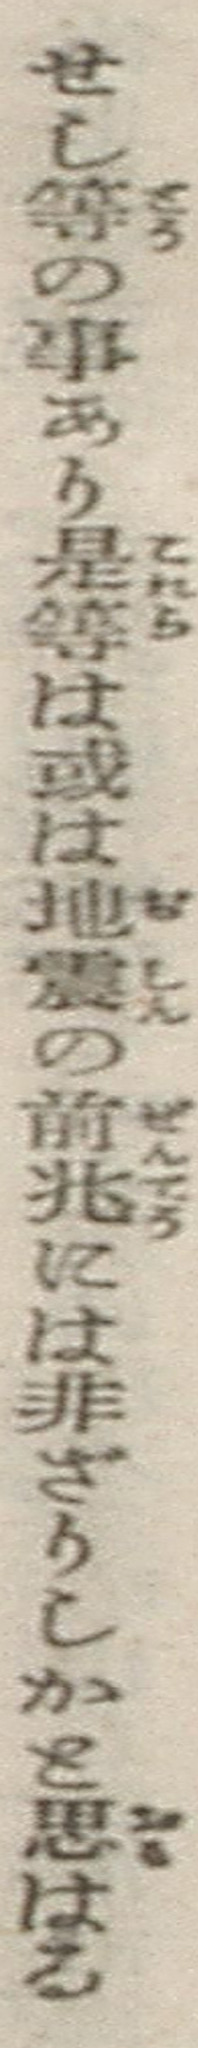せし等の事あり是等は或は地震の前兆には非ざりしかと思はる
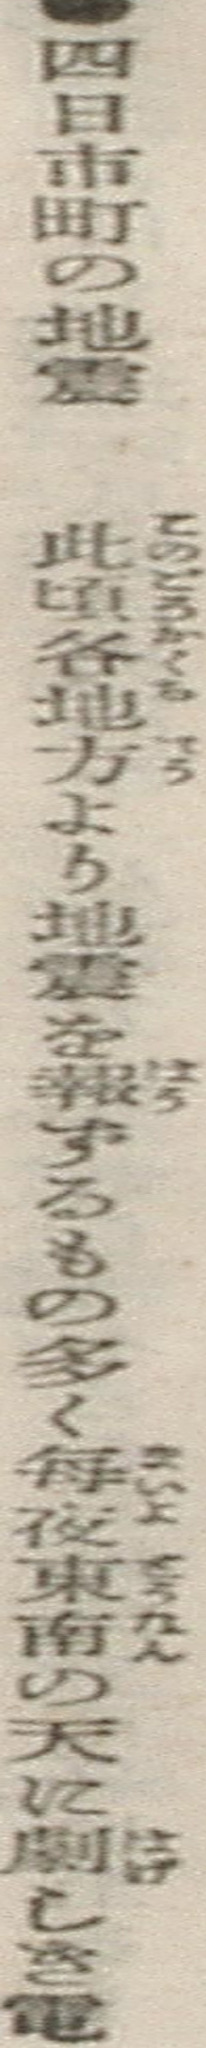●四日市町の地震此頃各地方より地震を報ずるもの多く毎夜東南の天に劇しき電
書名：愛知岐阜福井三県　大地震見聞録（内題）
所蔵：東京大学地震研究所図書室 Earthquake Research Institute Library, The University of Tokyo, JAPAN
